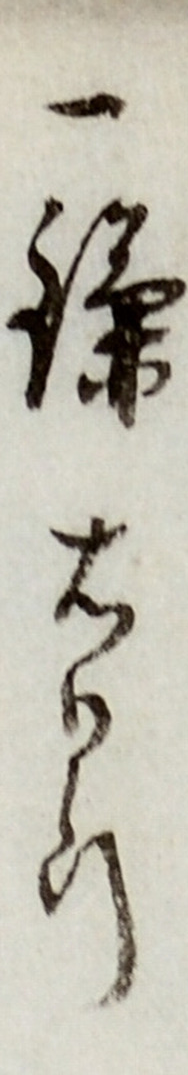一鎌右同断
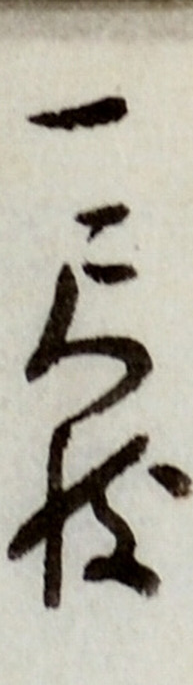一尺杖
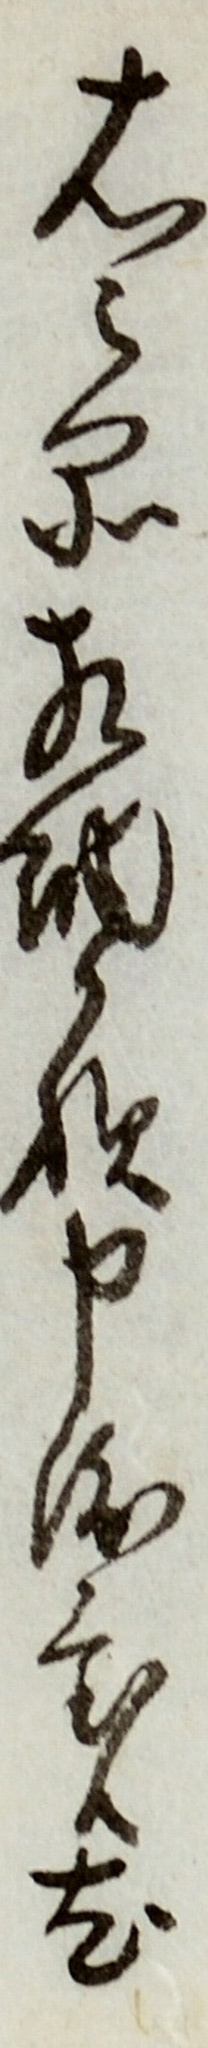右之品相納候様申渡置候尤
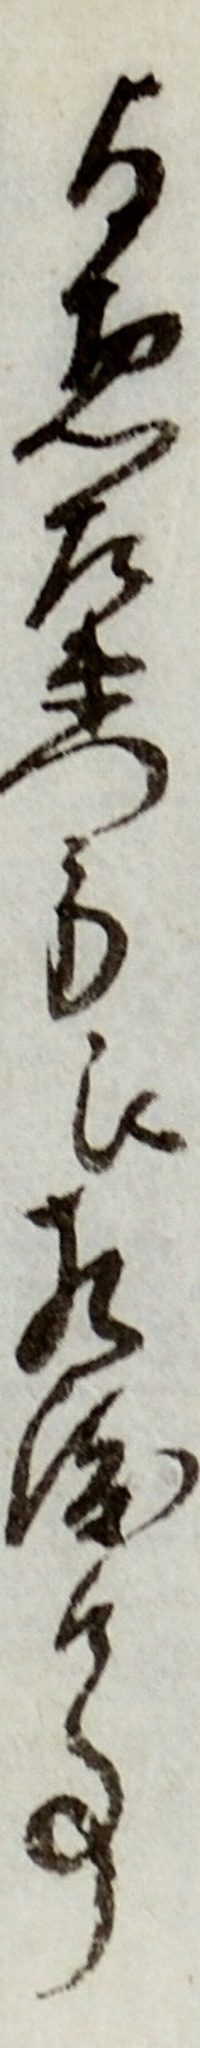与惣左衛門方江相渡候事
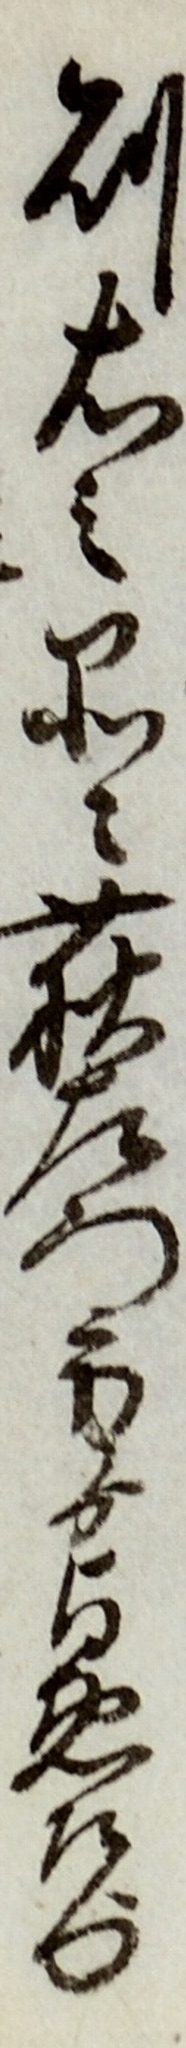則右之品々萩左衛門方より与惣左衛門
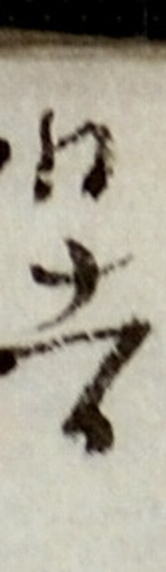同十一日
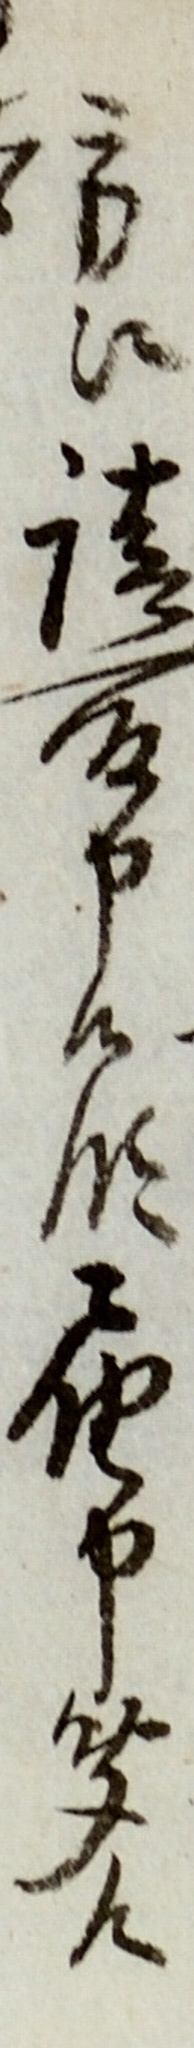方え請取申候段届申聞候
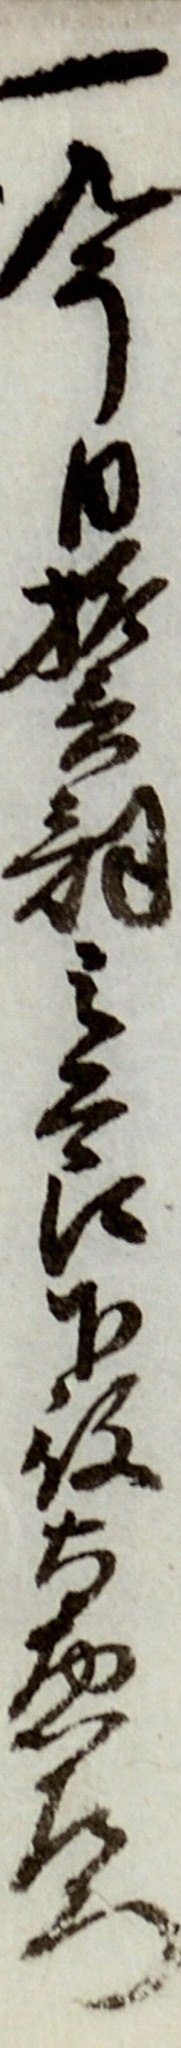一今日誓詞之節下役与惣左衛門
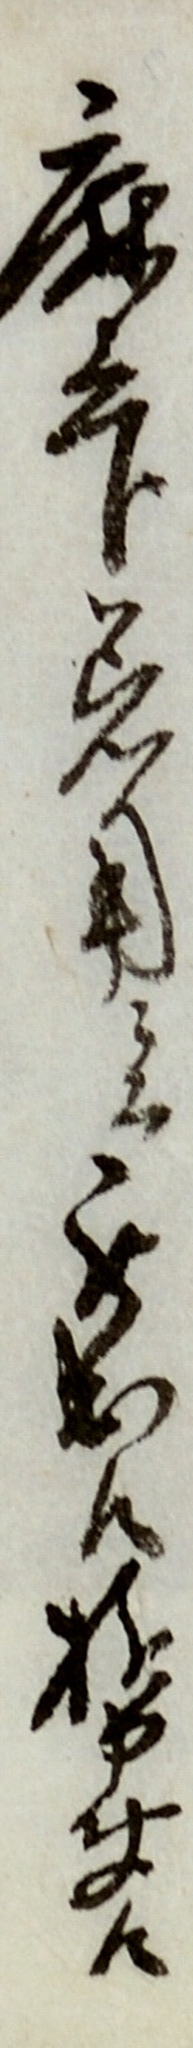麻上下着用にて罷出候様申聞候
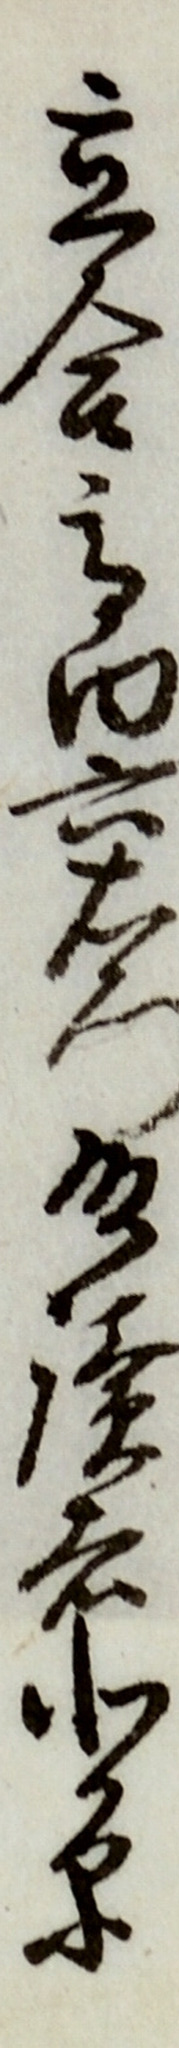立合高田六右衛門殿読者北原
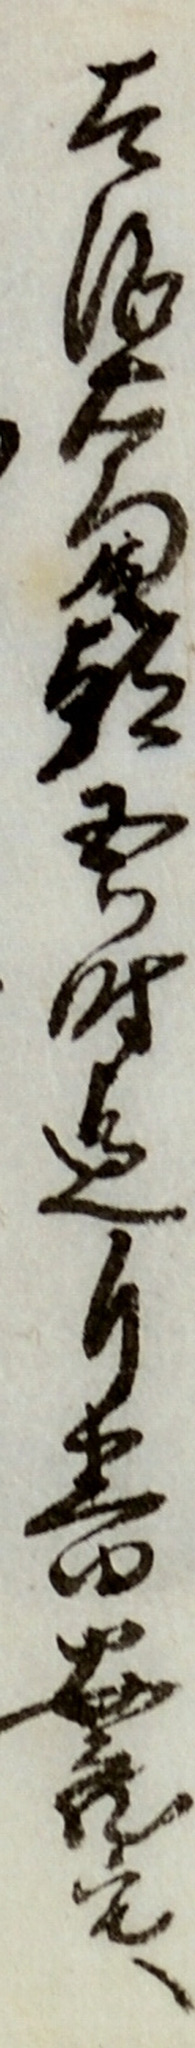太治右衛門殿朝五ツ時過月番安蔵宅へ
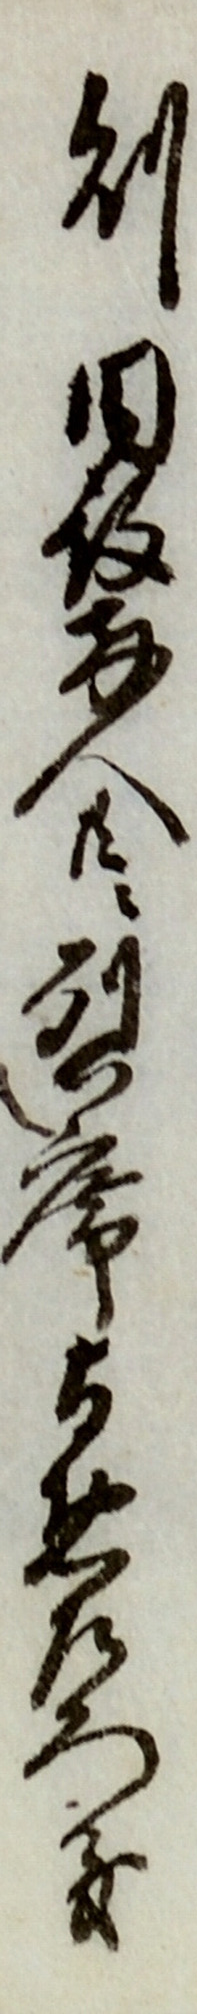則同役両人共に烈席与惣左衛門家
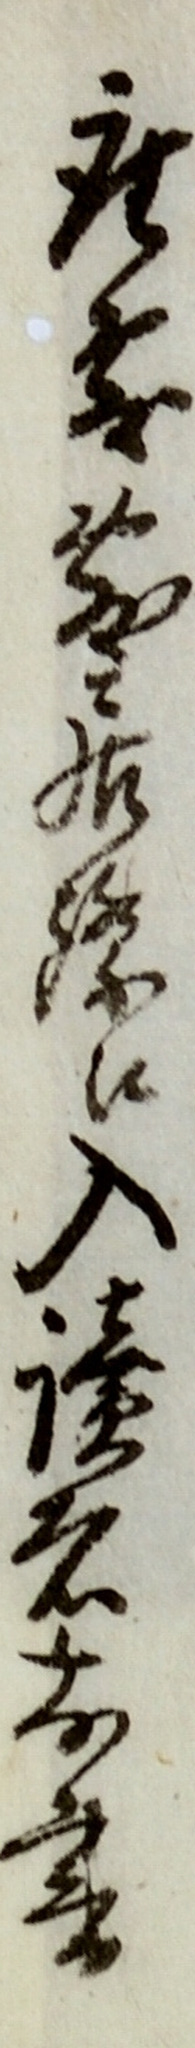座敷敷居際え入読者前書
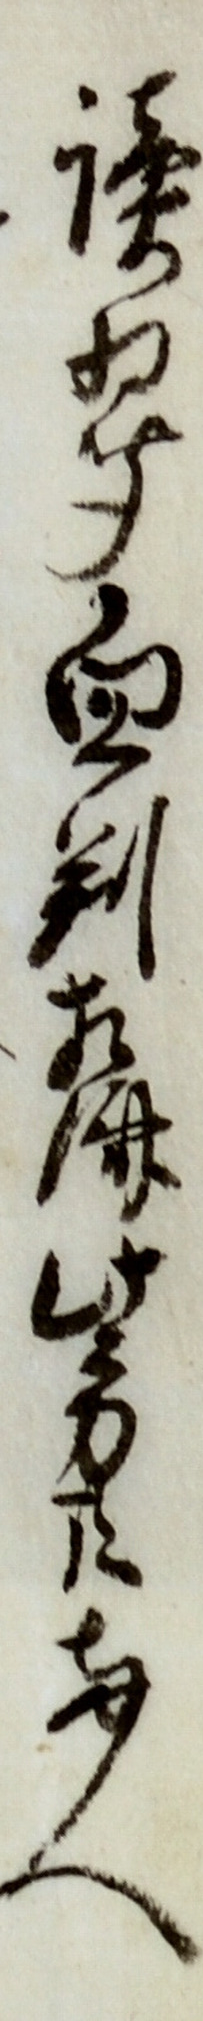読為聞血判相済此方共両人
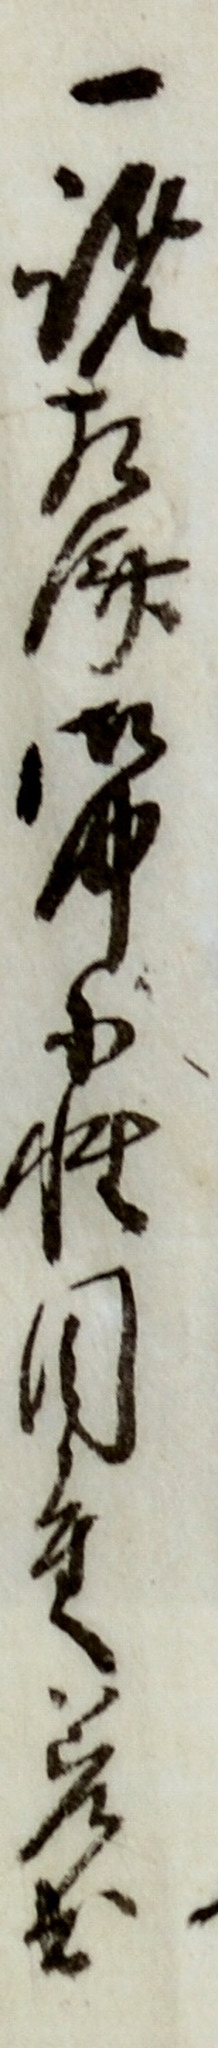一覧相済御中小性目付へ差出
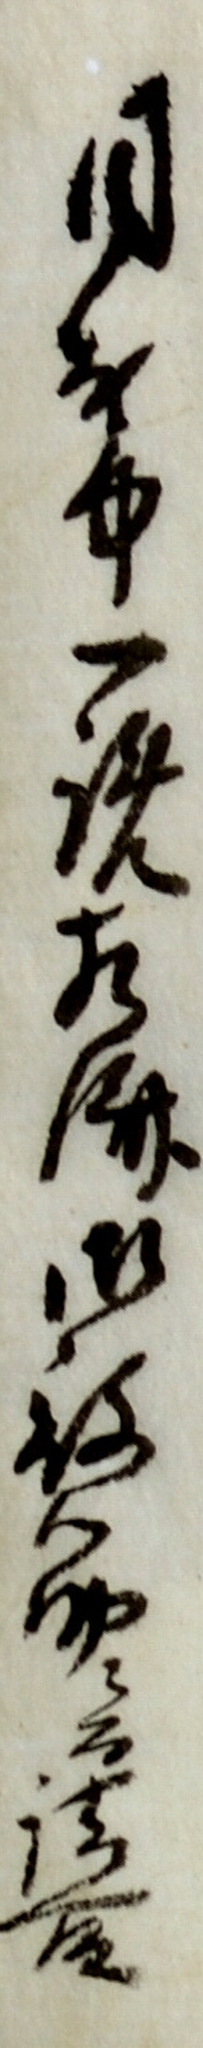目付中一覧相済御役筋にて請取
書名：諸事御用留帳
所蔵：伊那市立高遠町図書館・合同会社AMANE
